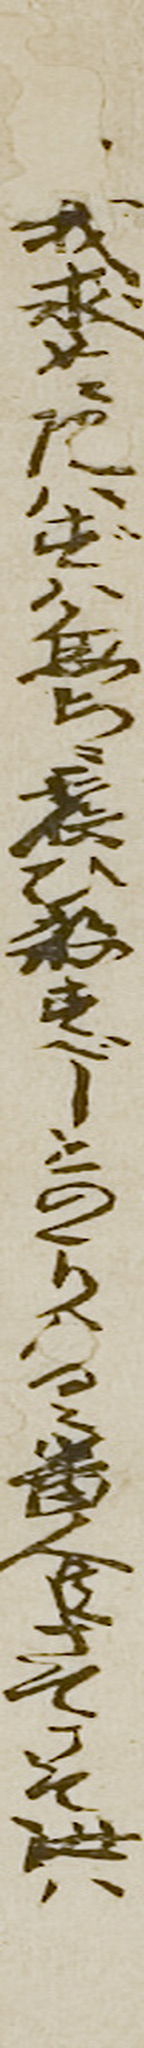もし我求めに随はずは忽ちに震ひ殺すべしとのくりけるに番人共さてさて汝は
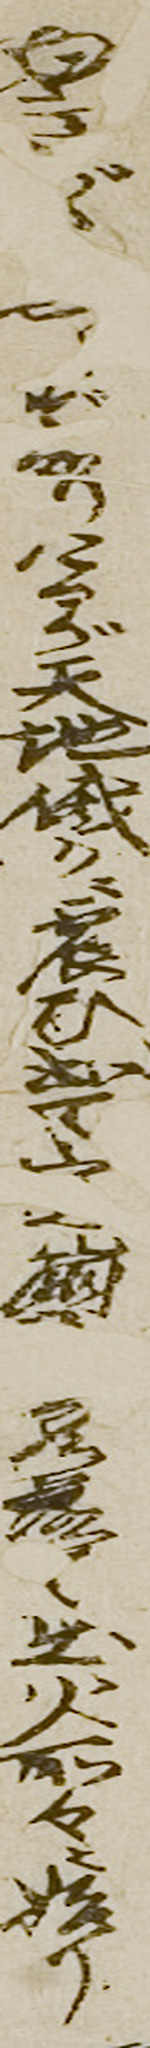ゆきがたしらずなりけるが天地俄かに震ひ出て家崩れ蔵落て出火所々に始り
